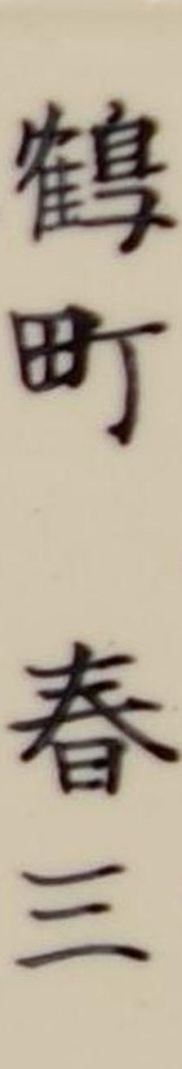鶴町春三
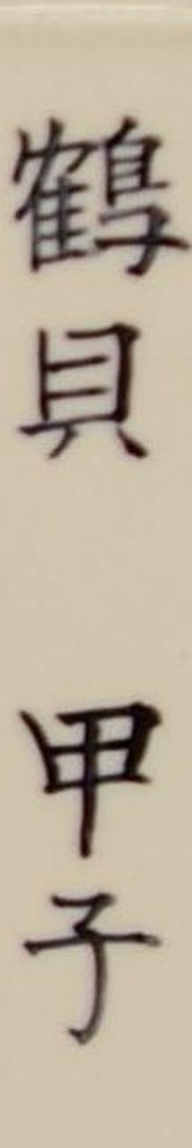鶴貝甲子
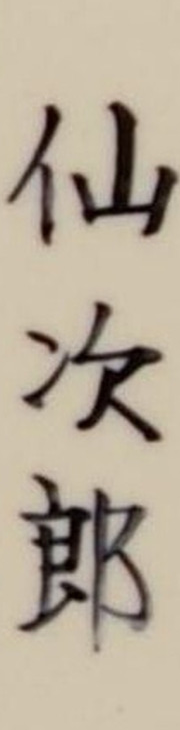仙次郎
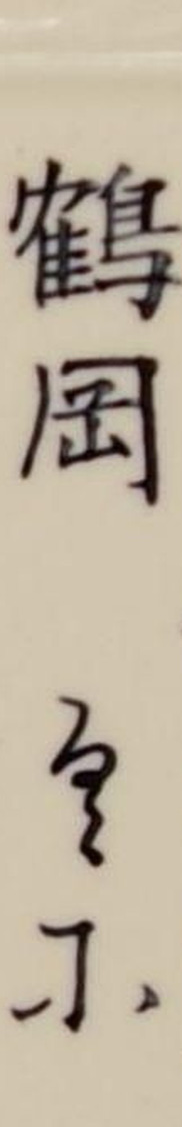鶴岡くに
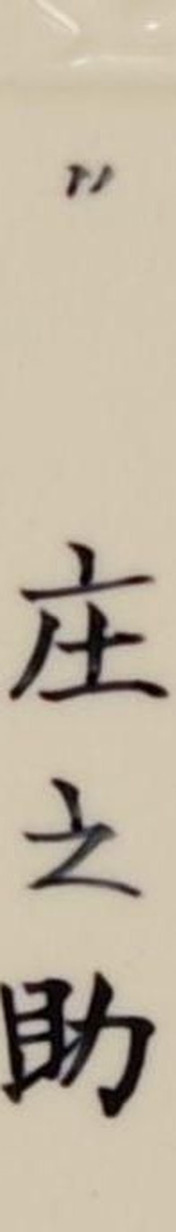庄之助
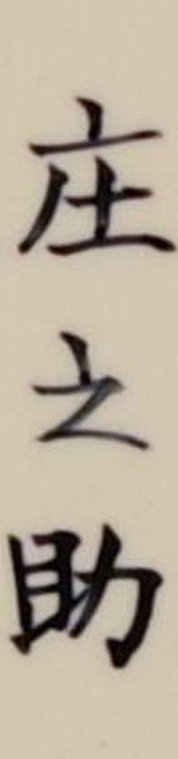庄之助
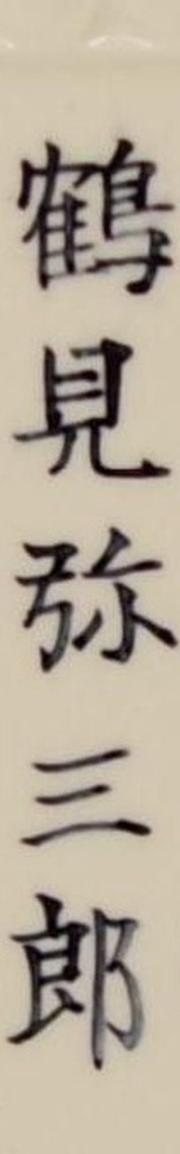鶴見弥三郎
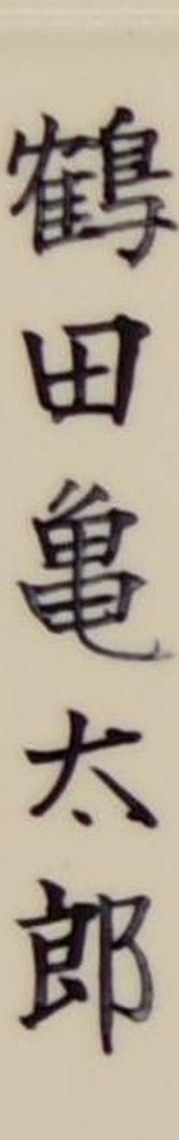鶴田亀太郎
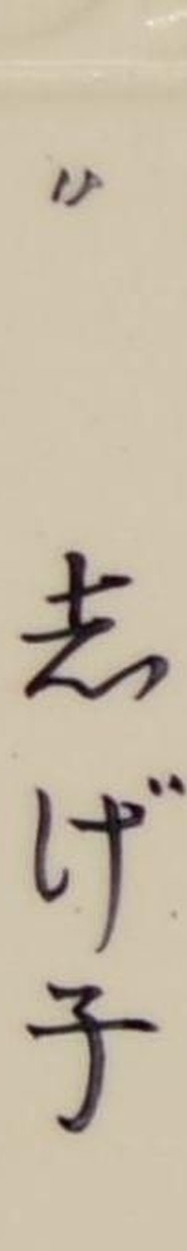しげ子
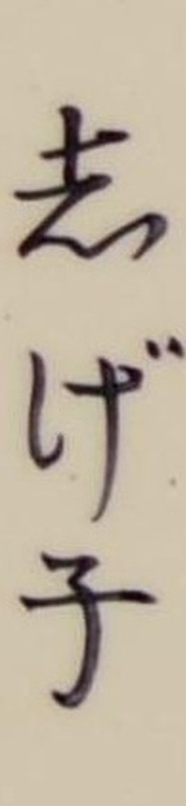しげ子
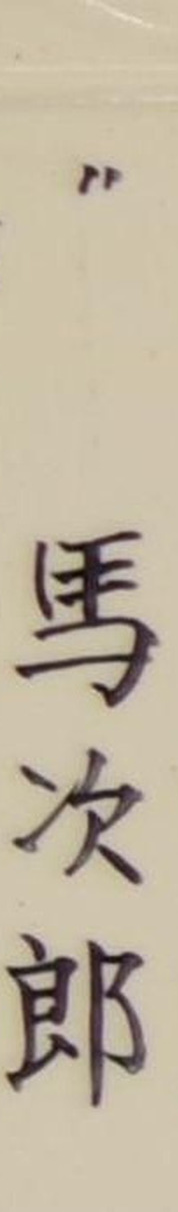馬次郎
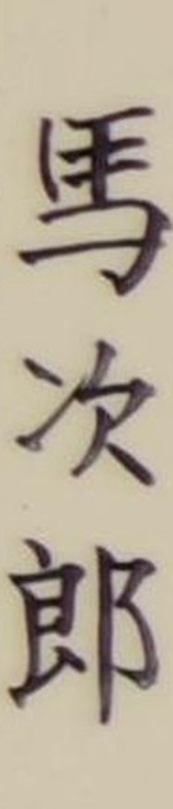馬次郎
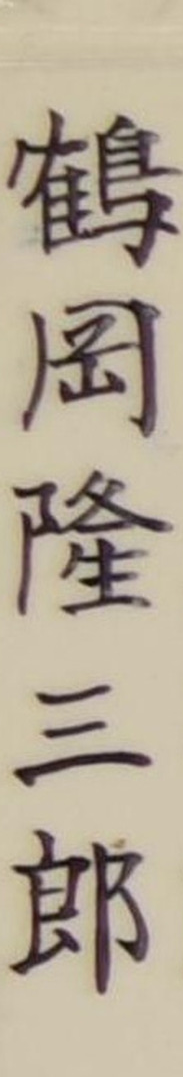鶴岡隆三郎

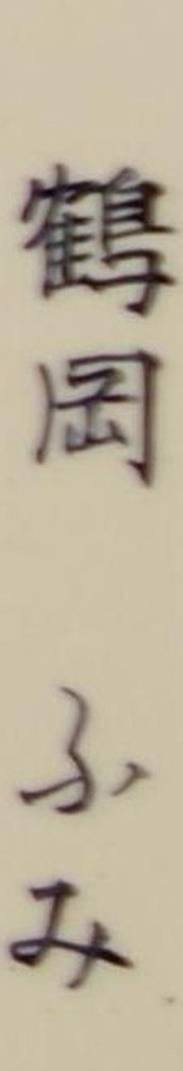鶴岡ふみ
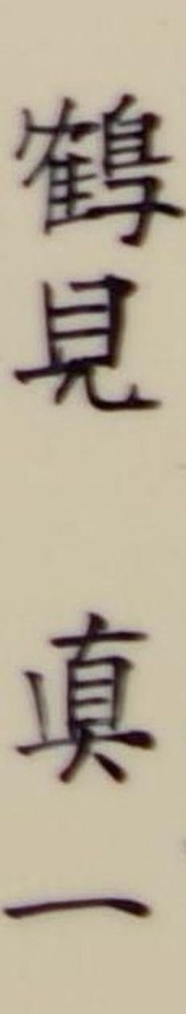鶴見真一
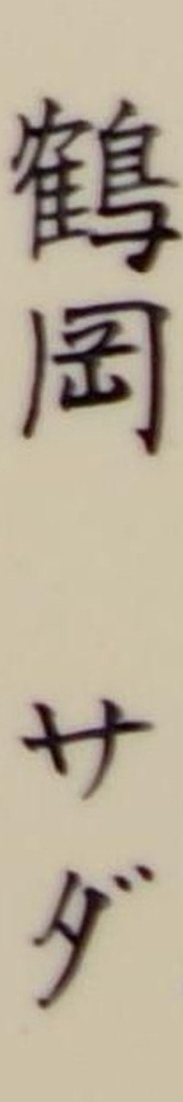鶴岡サダ
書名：E~L
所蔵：高野山金剛峯寺
